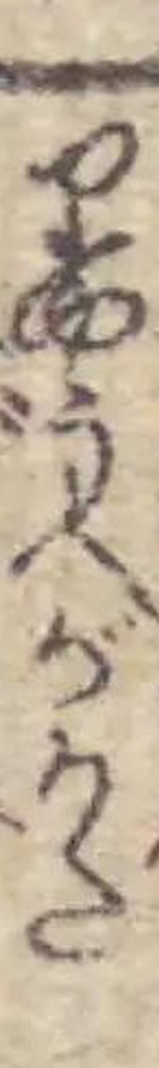りやう人がかた
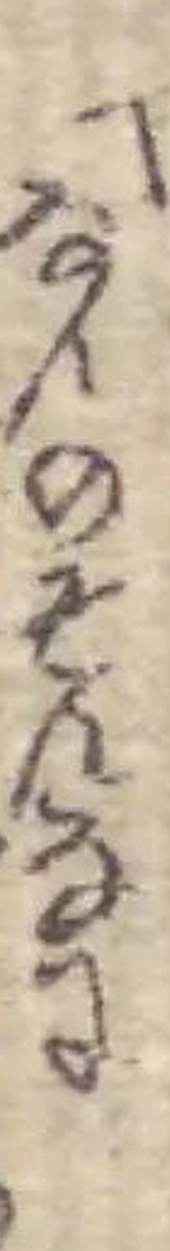〽なんのそんなに
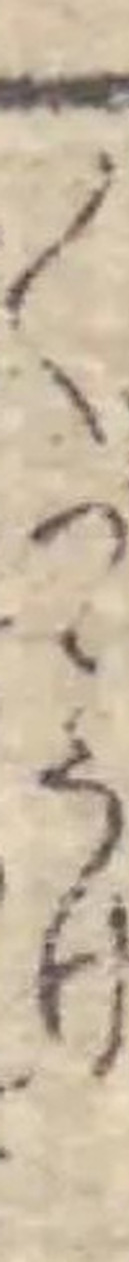〳〵づゝうけ
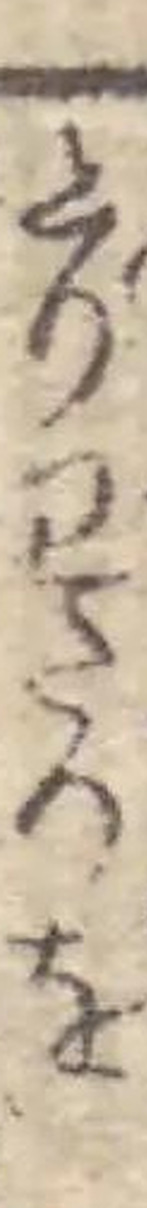とりわたりを
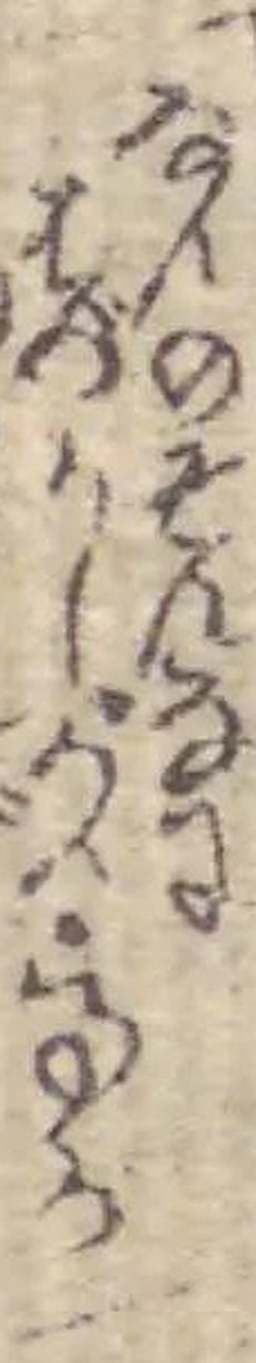はづかしがる事か
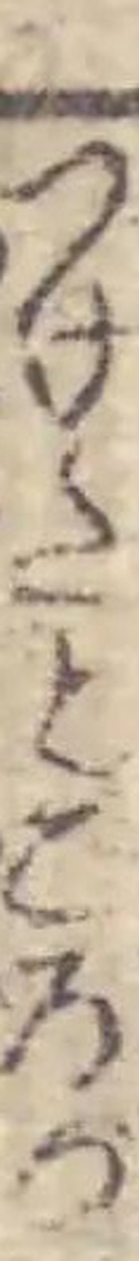つけたところが
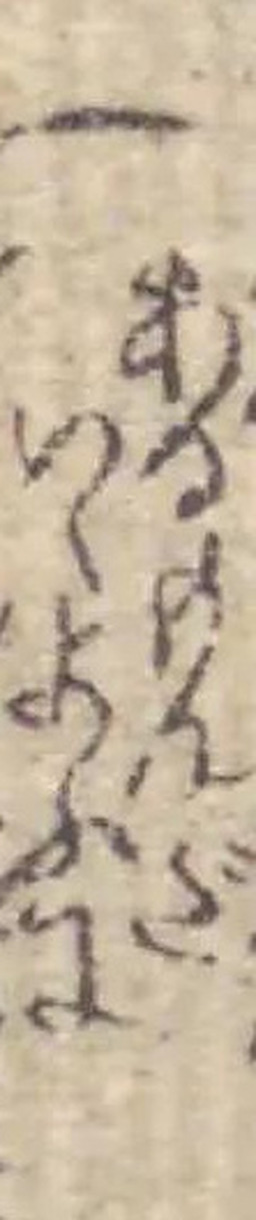いゝよふに
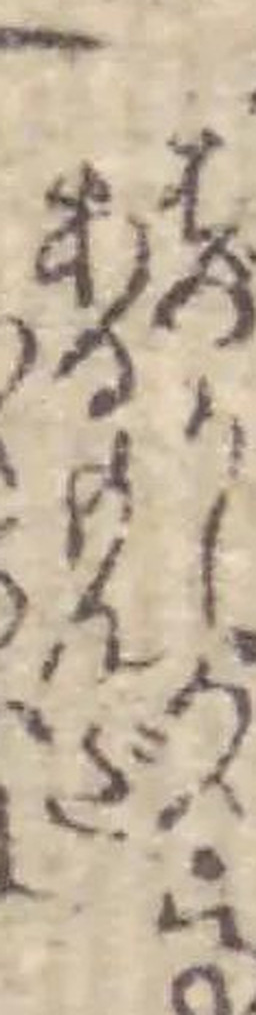あるもんだ
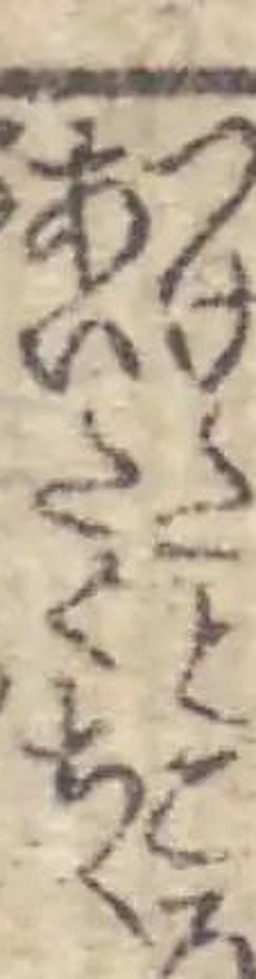あいたくちへ
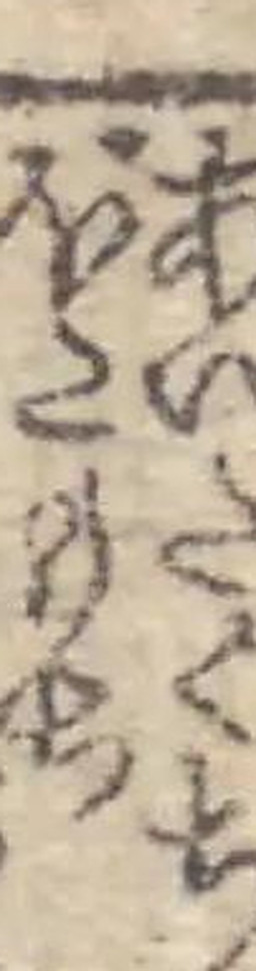ぼたもち
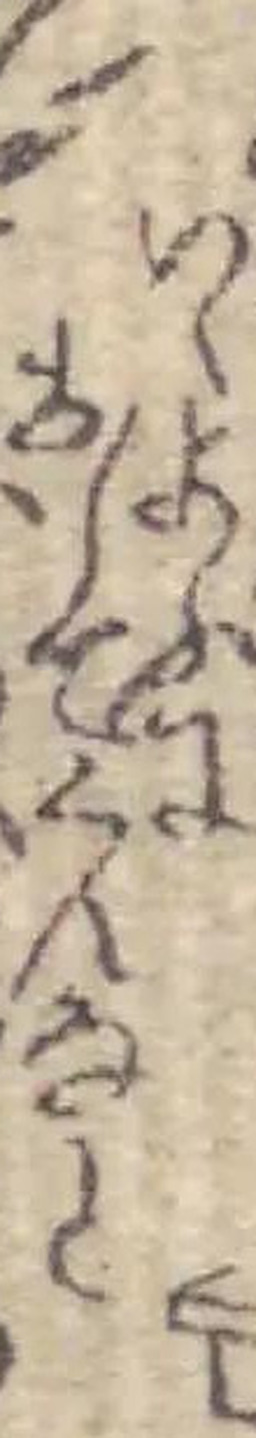おいてくんなと
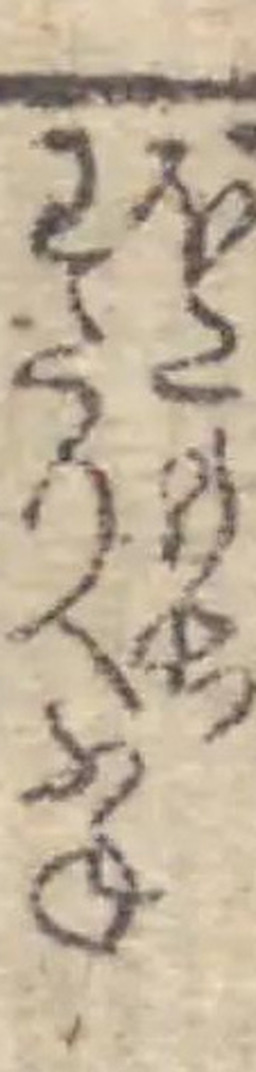わたりへふね
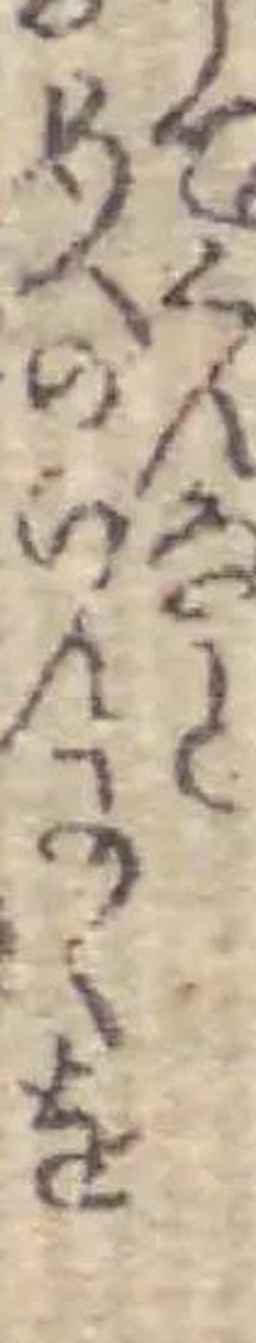おめへのいんにくを
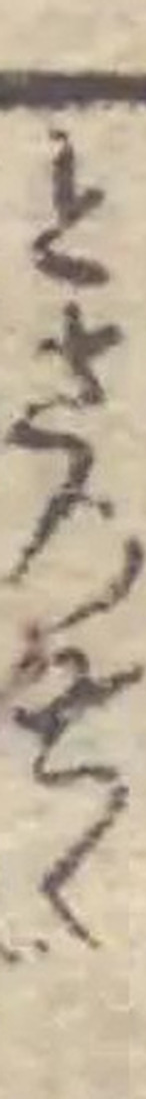とさつそく
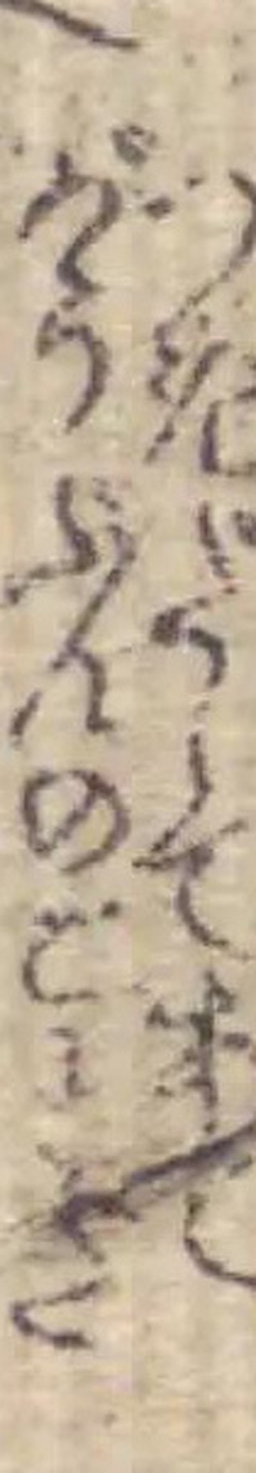がうぶんのことだ
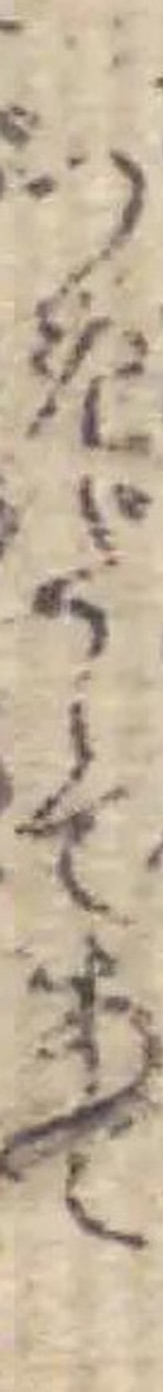つきだしてあて
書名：化物尽 4巻
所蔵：国立国会図書館 National Diet Library, JAPAN
